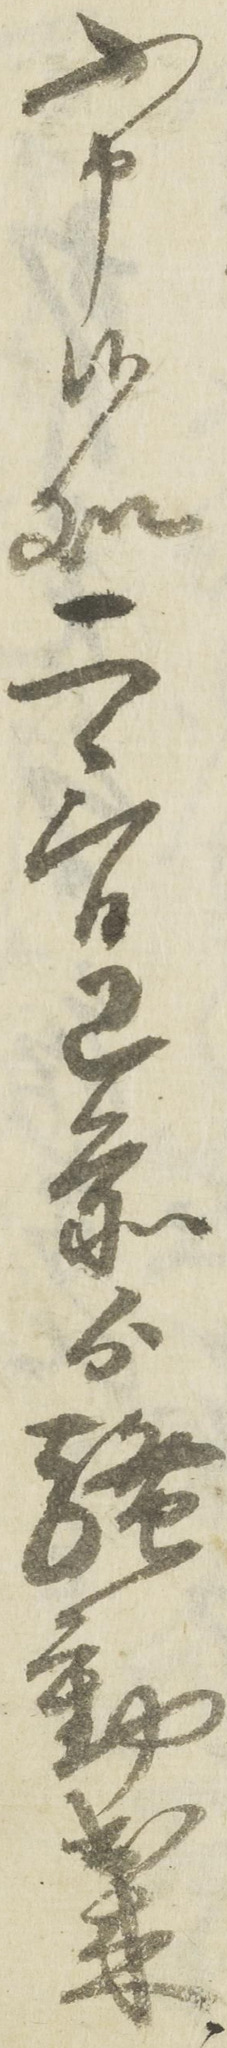不申候処二三日已前ゟ騒動出来
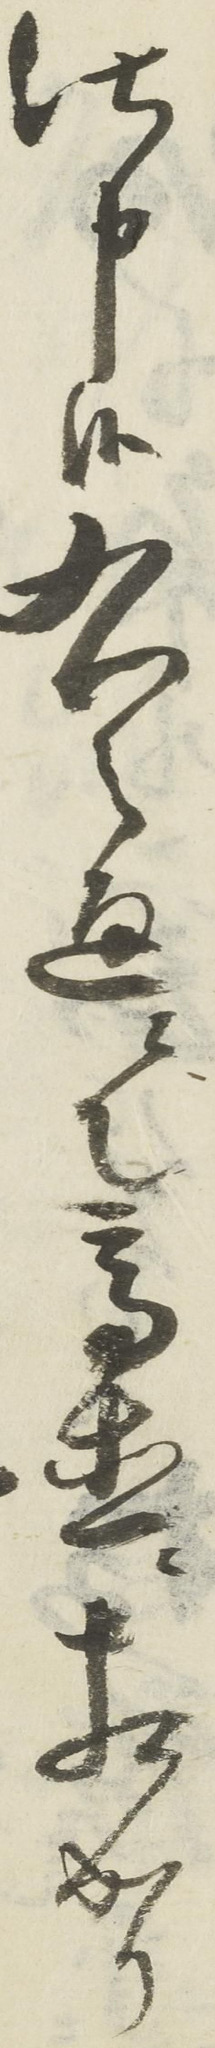仕申候右之通ニて高直ニ相成り
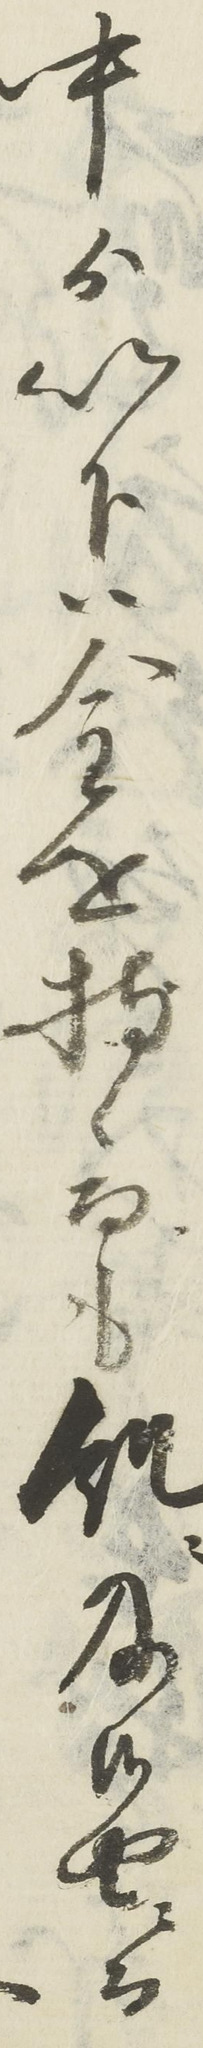中ゟ以下は金を持候而も飢ニ及候由ニ而
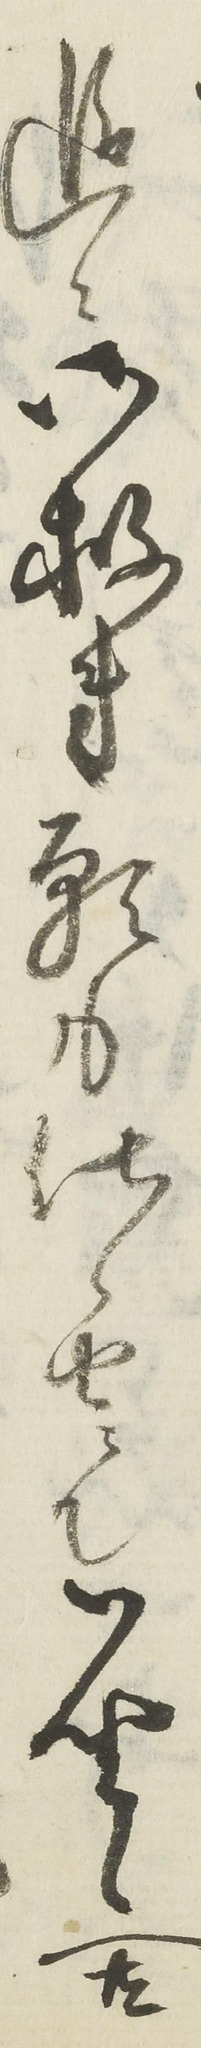追〻御救米願も仕候由ニて御坐候へ共
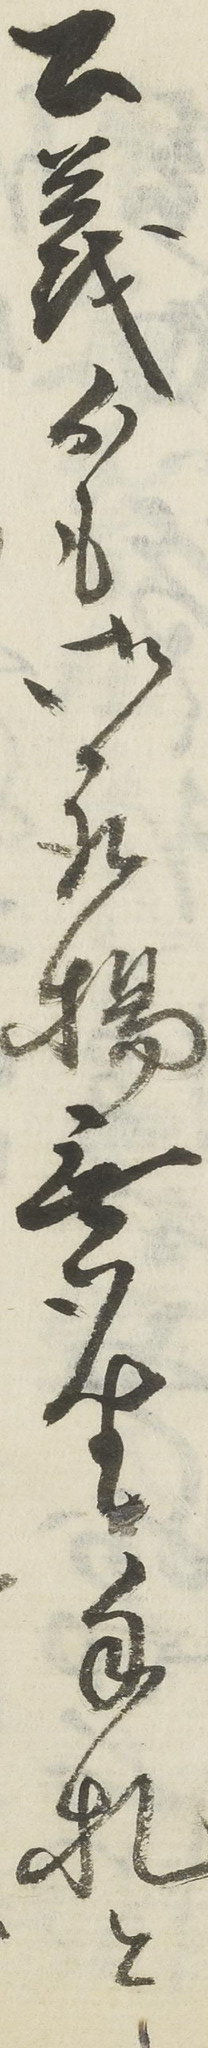公義ゟも御取揚無御坐手札と
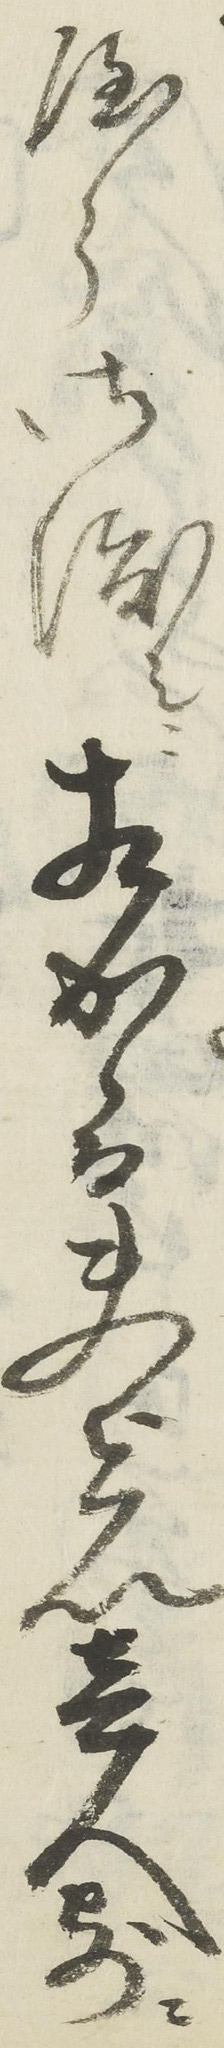やら御渡シニ相成候而夫迄以壱人前ニ
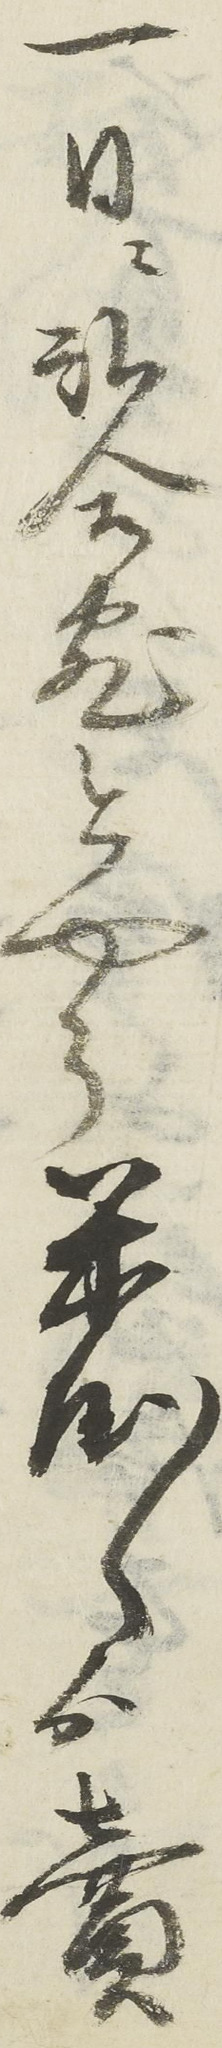一日ニ弐合宛とやら米屋〳〵ゟ売
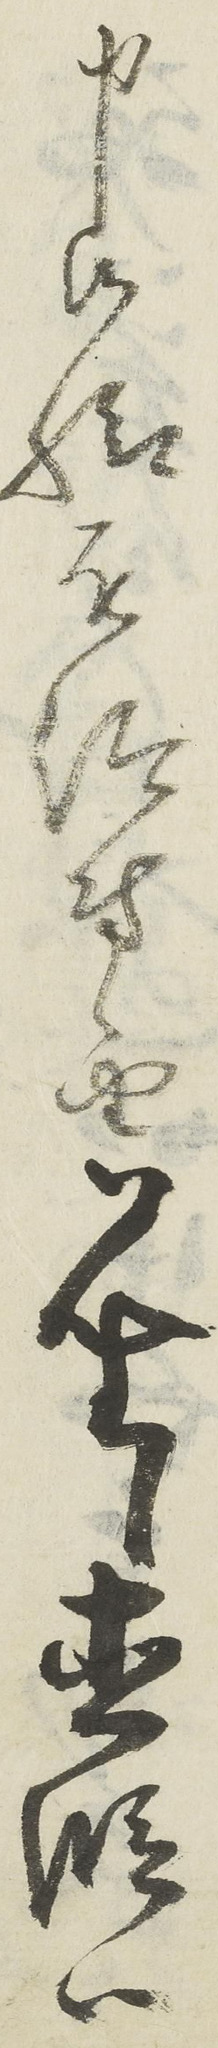申候様被仰付候由御座候直段は
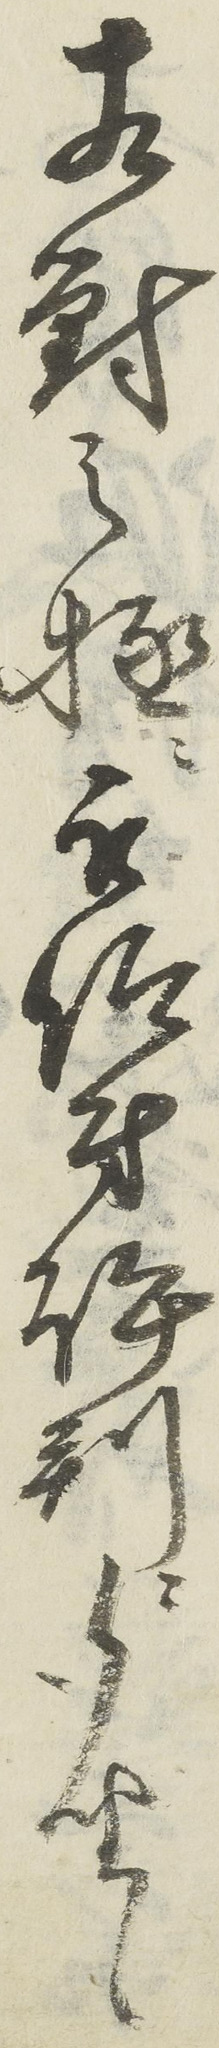相対之極ニ被仰付評判ニ御坐候
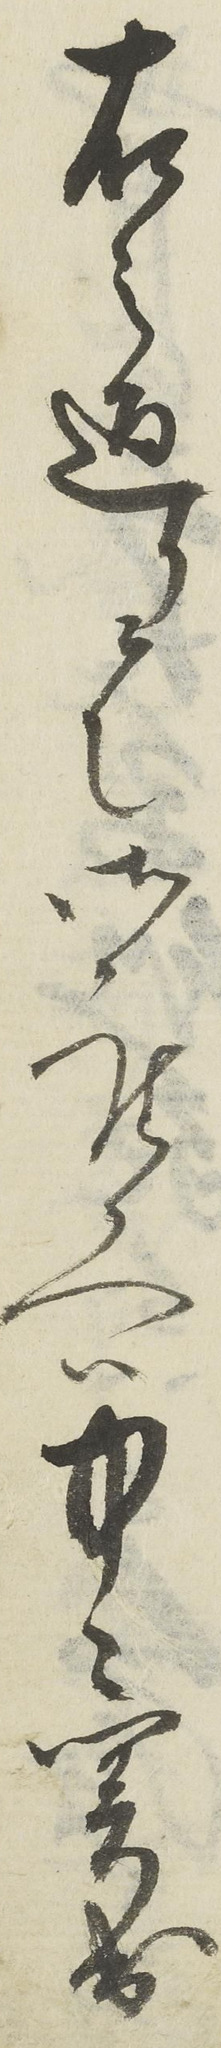右之通りニて御座候へは中〻買出

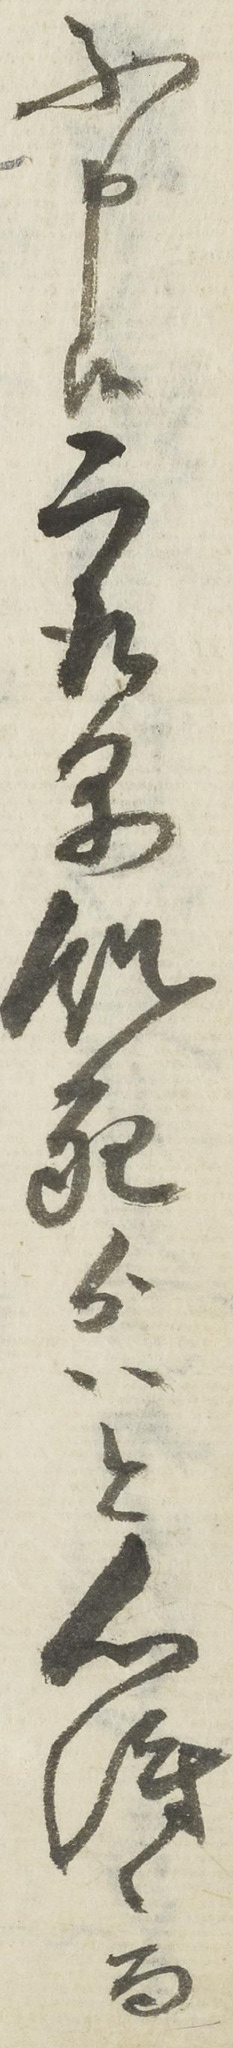不申候最早飢ゟはと心得候而
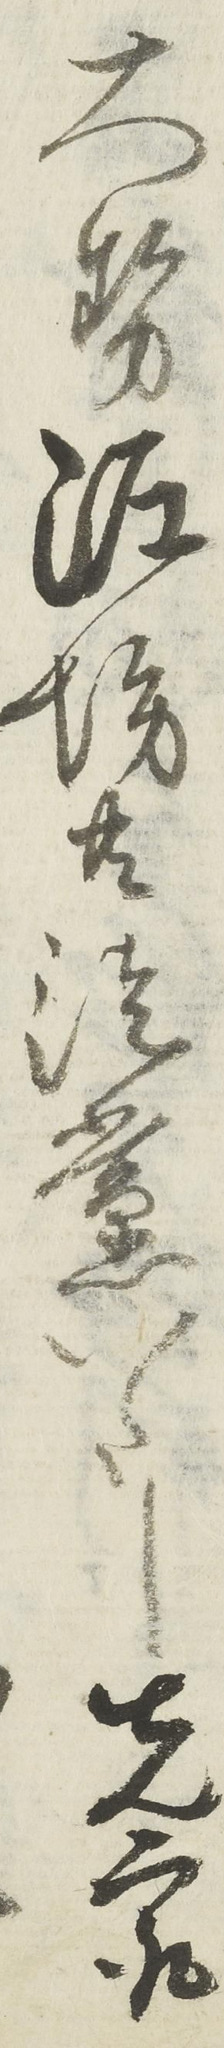大勢泥坊共徒党いたし先最
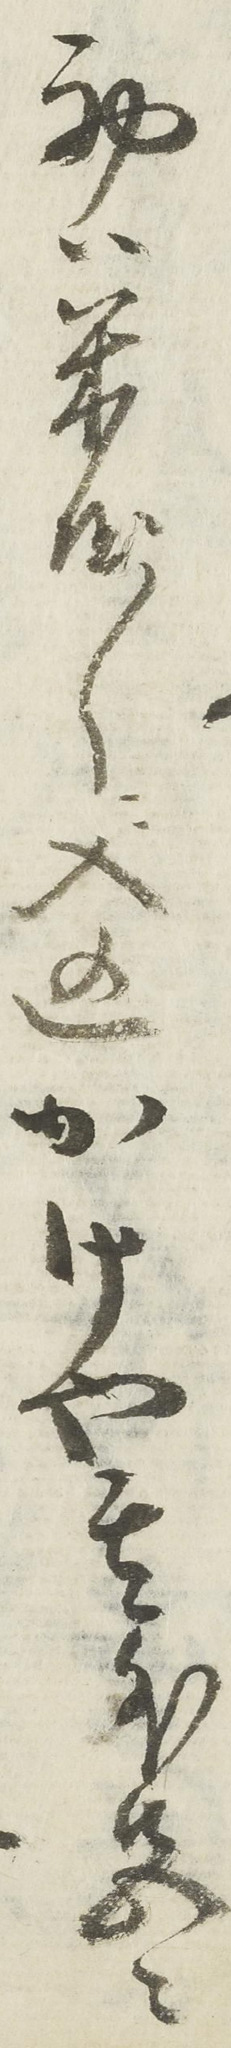初は米屋〳〵ニ入込かけや其外色〻
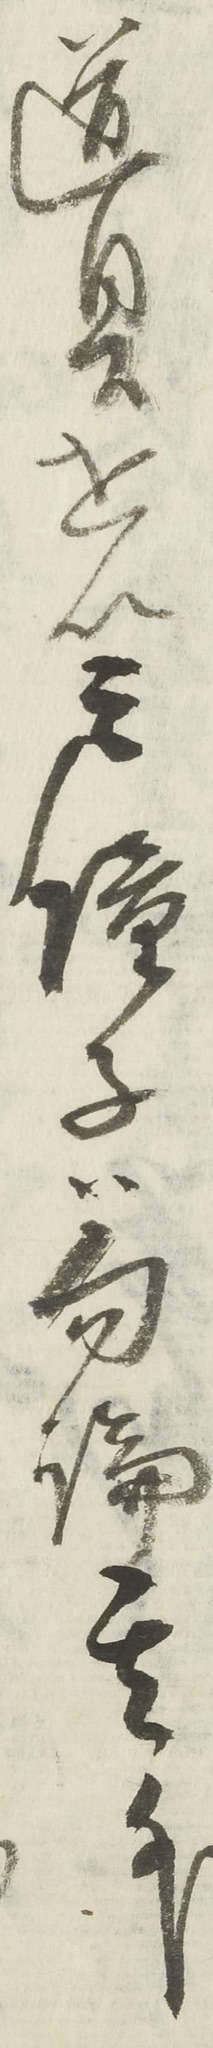道具を以戸障子は勿論其外
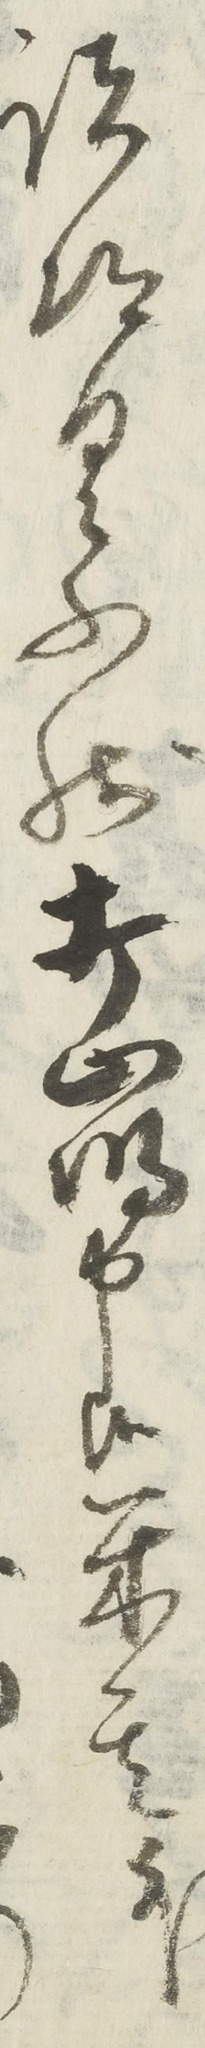諸道具不残打崩申候米其外
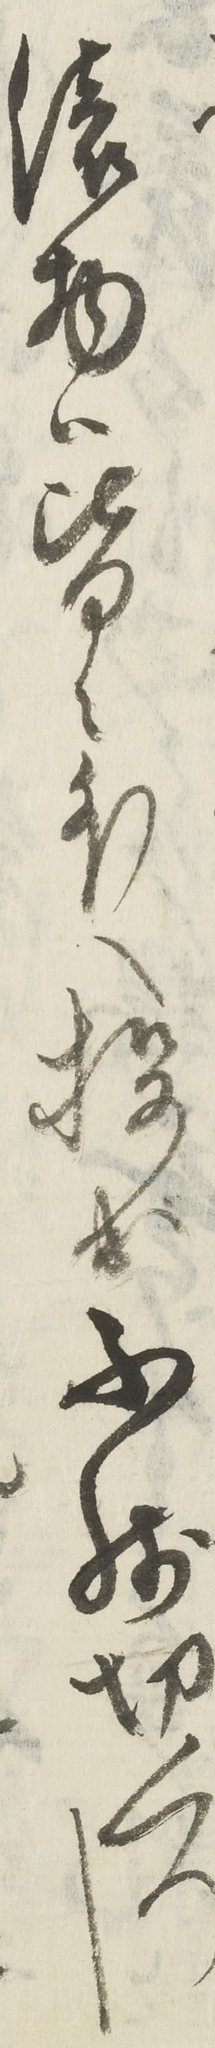俵物は皆〻外へ投出不残切くつし
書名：後見笑
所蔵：東京大学地震研究所図書室 Earthquake Research Institute Library, The University of Tokyo, JAPAN
